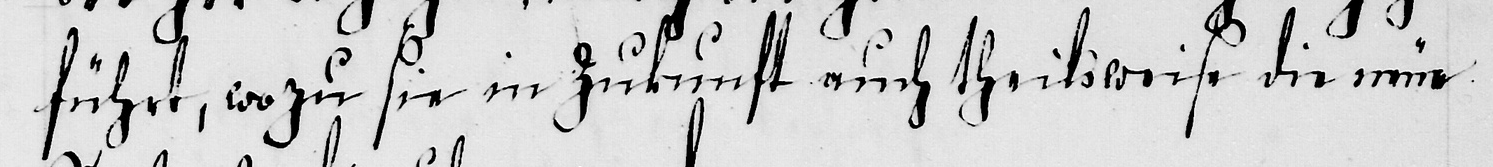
führt, wozu sie in Zukunft auch theilsweise die neue
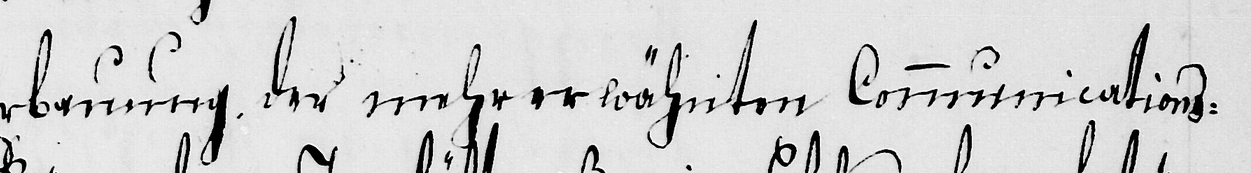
bauung der mehrerwähnten Communications¬
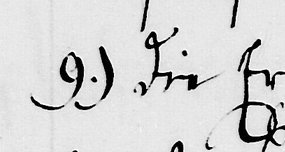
9.) Die Er¬
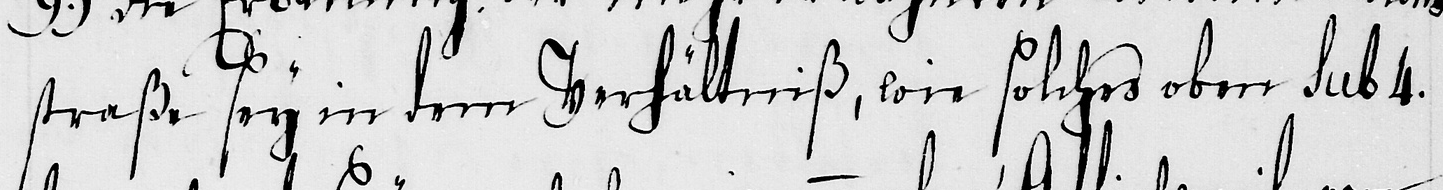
straße sey in dem Verhältniß, wie solches oben sub 4.
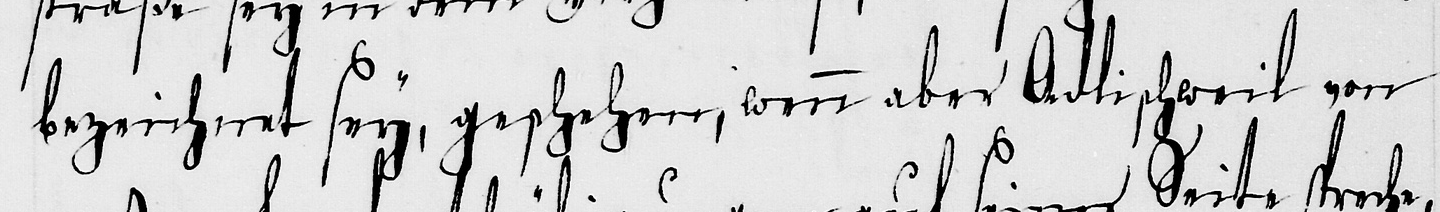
bezeichnet sey, geschehen, wenn aber Adlischweil von
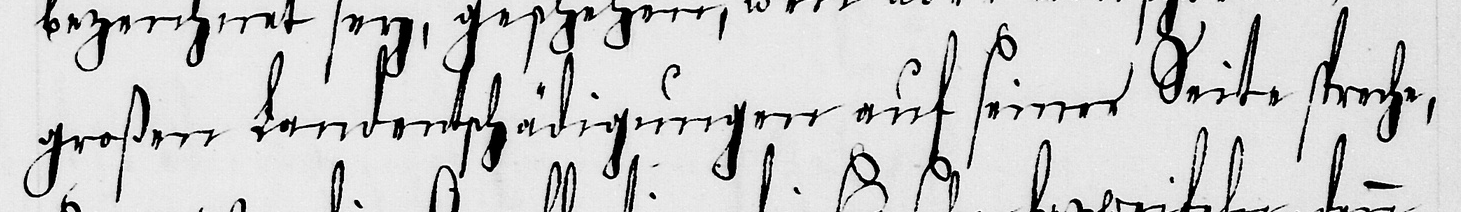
großen Landentschädigungen auf seiner Seite spreche,
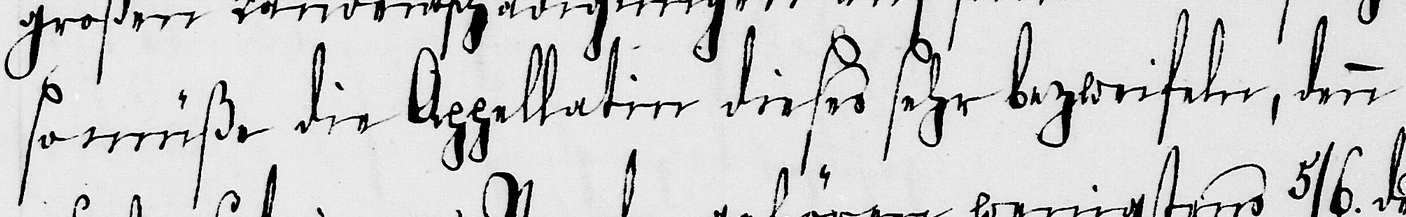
so müße die Appellatin dieses sehr bezweifeln, denn
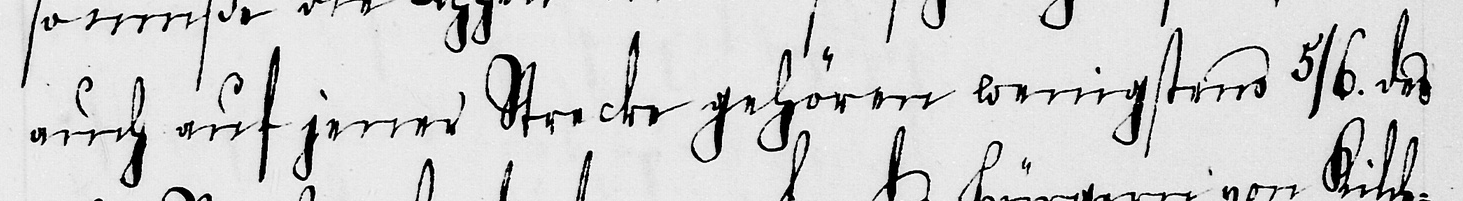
auch auf jener Strecke gehören wenigstens 5/6. des
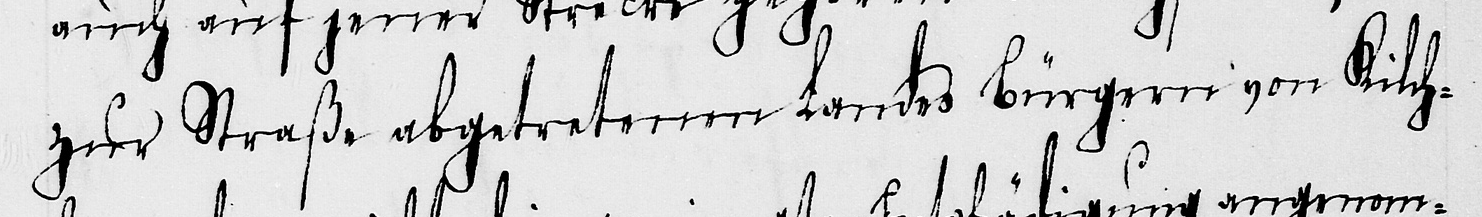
zur Straße abgetretenen Landes Bürgern von Kilch¬
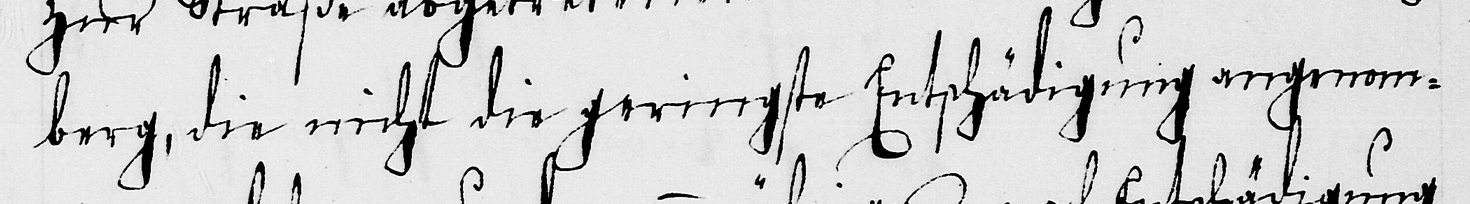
berg, die nicht die geringste Entschädigung angenom¬
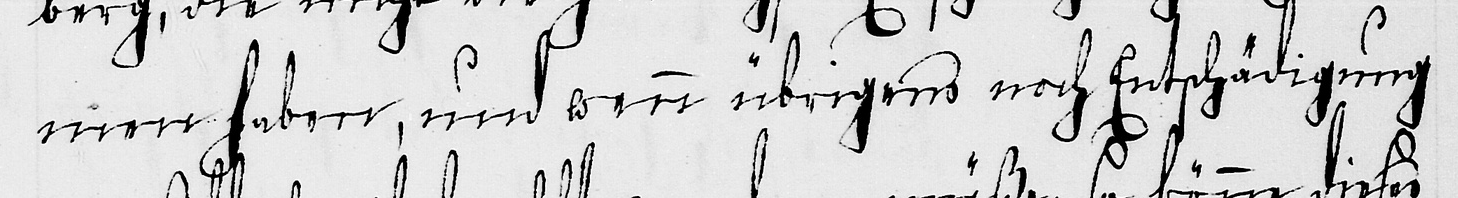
men haben, und wenn übrigens noch Entschädigung
